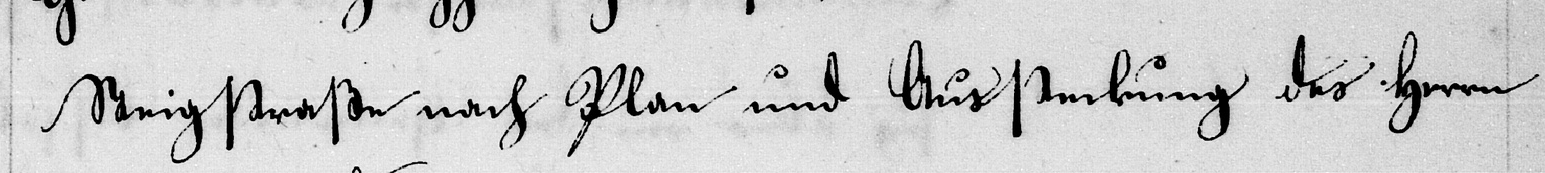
Steigstraße nach Plan und Aussteckung des Herrn
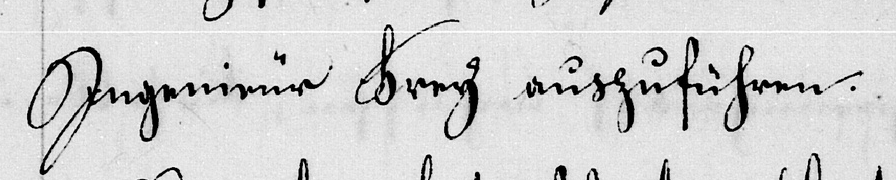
Ingenieur Frey auszuführen.
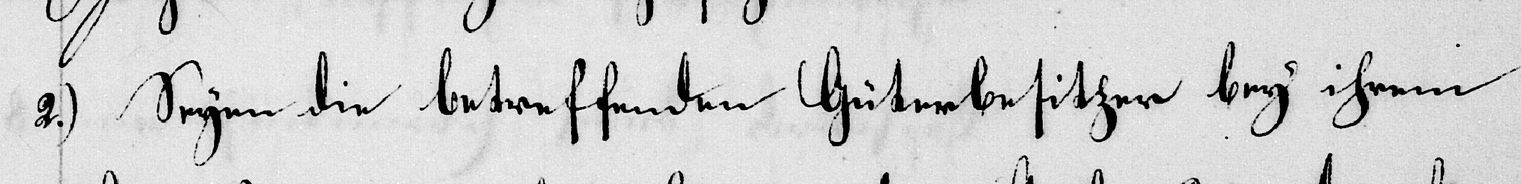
2.) Seyen die betreffenden Güterbesitzer bey ihrem
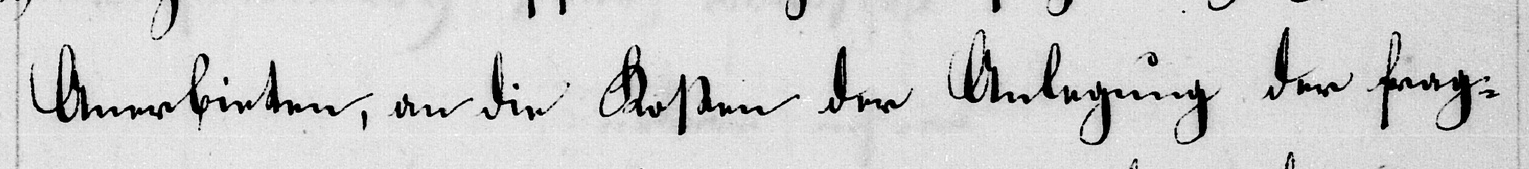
Anerbieten, an die Kosten der Anlegung der frag¬
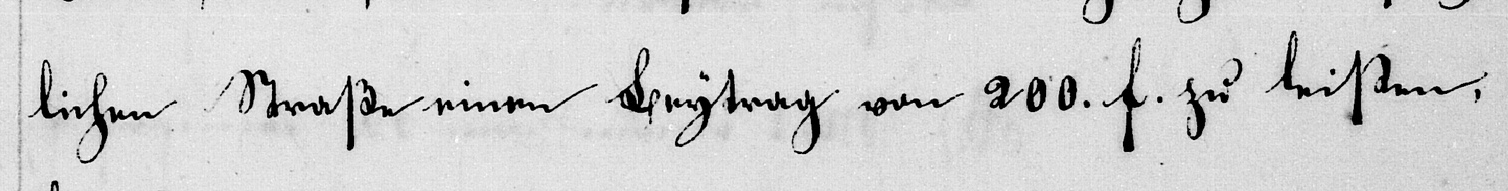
lichen Straße einen Beytrag von 200. f. zu leisten,
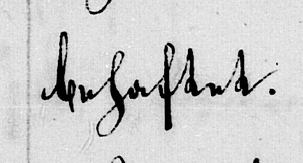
behaftet.
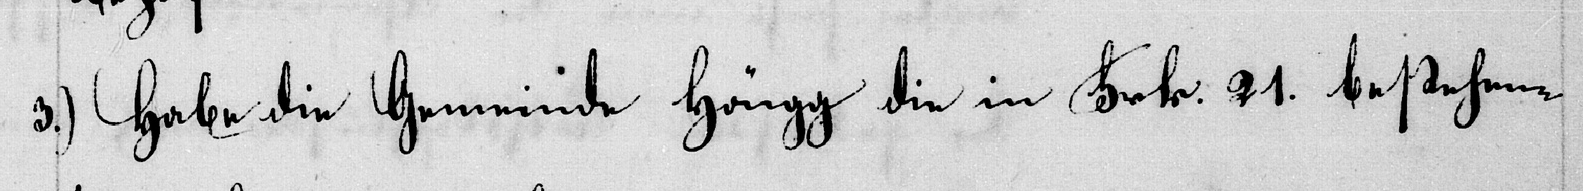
3.) Habe die Gemeinde Höngg die in Frk[en]. 21. bestehen¬
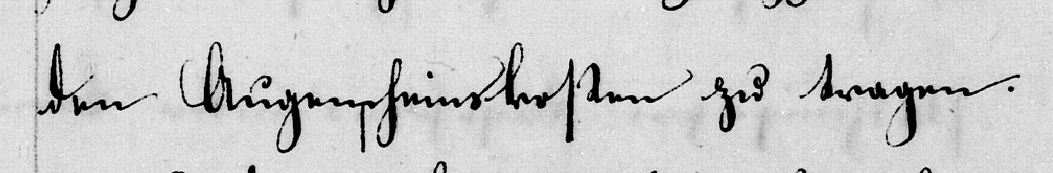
den Augenscheinskosten zu tragen.
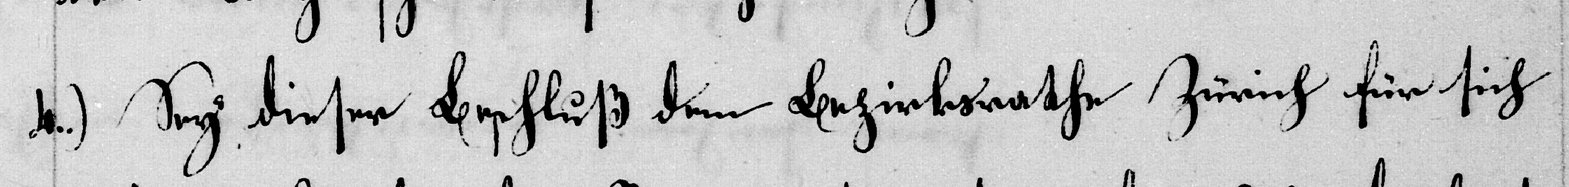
4.) Sey dieser Beschluß dem Bezirksrathe Zürich für sich
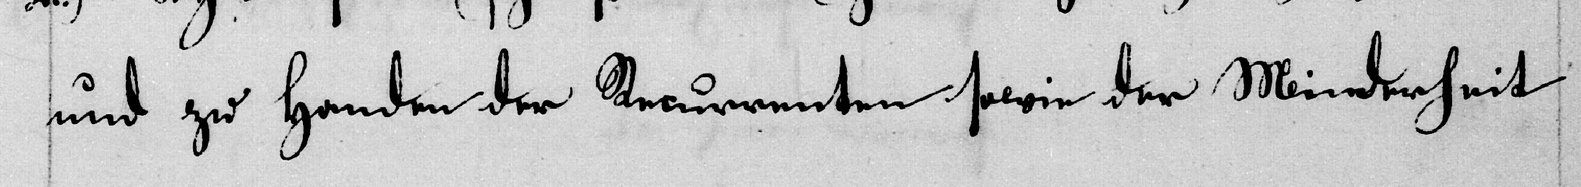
und zu Handen der Recurrenten sowie der Minderheit
